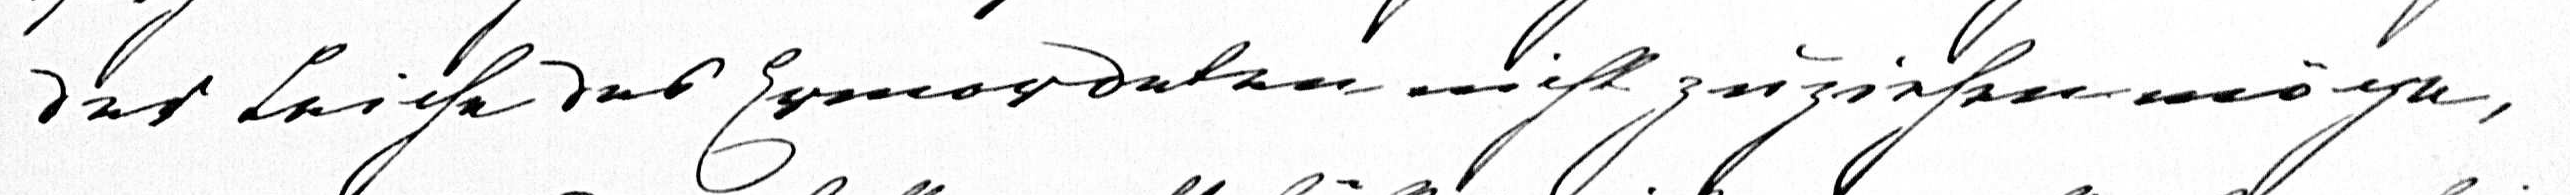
der Leiche des Ermordeten nicht zuziehen möge,
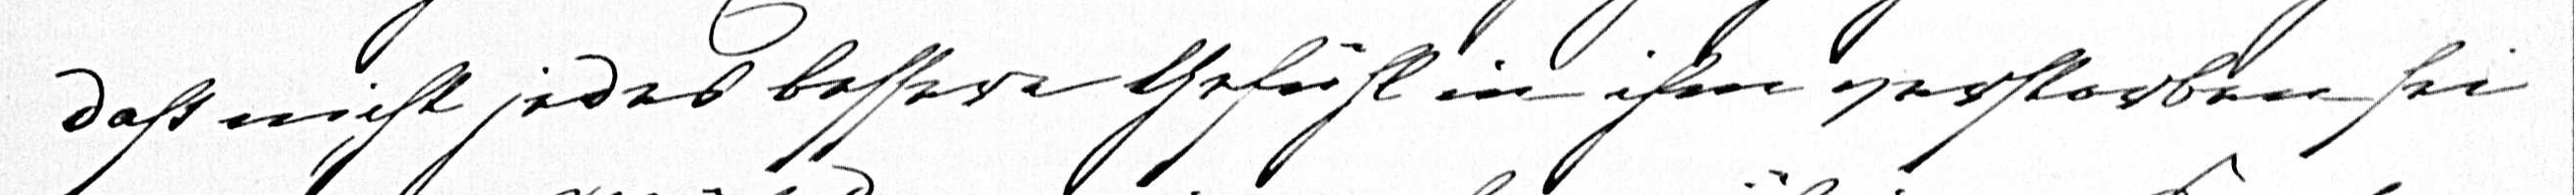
daß nicht jedes bessere Gefühl in ihm verstorben sei
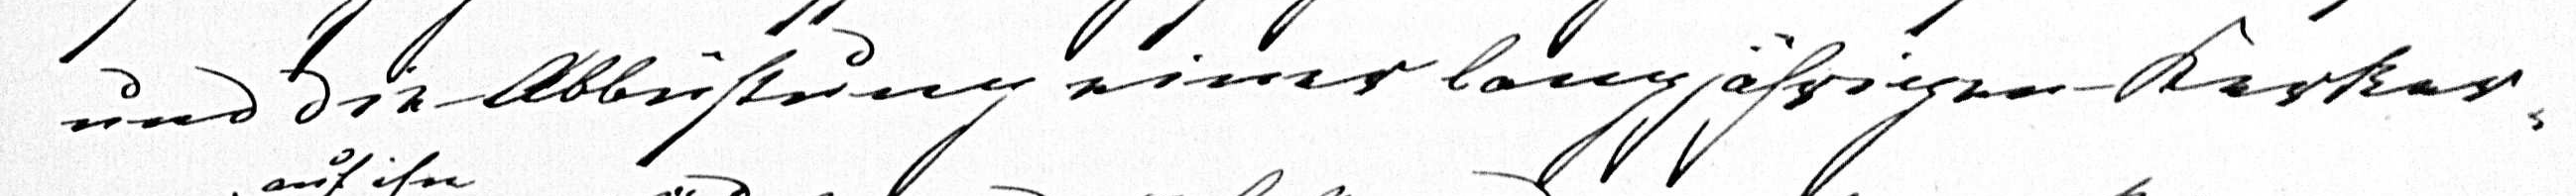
und die Abbüßung einer langjährigen Kerker¬
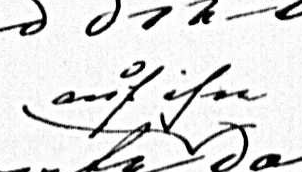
auf ihn
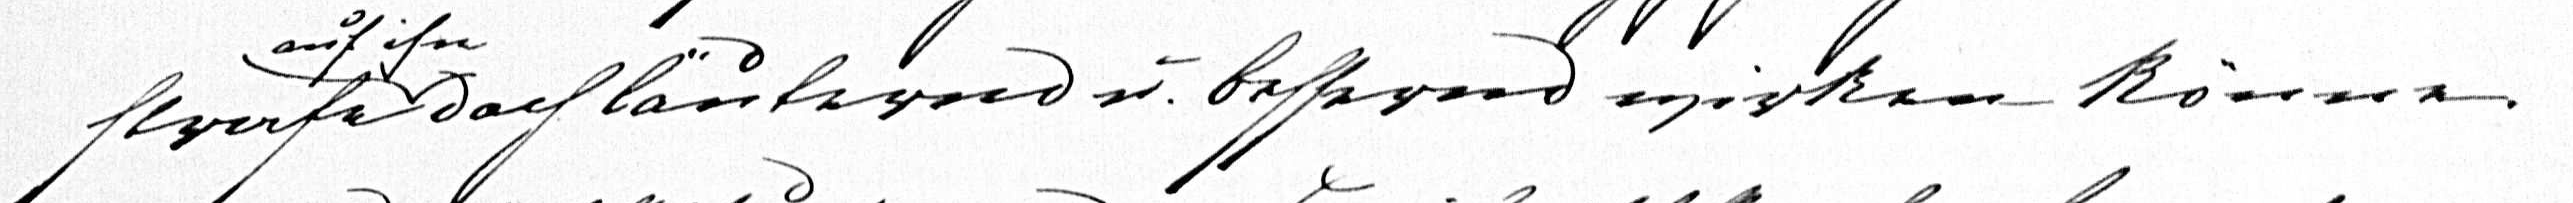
strafe doch läuternd u bessernd wirken könne.
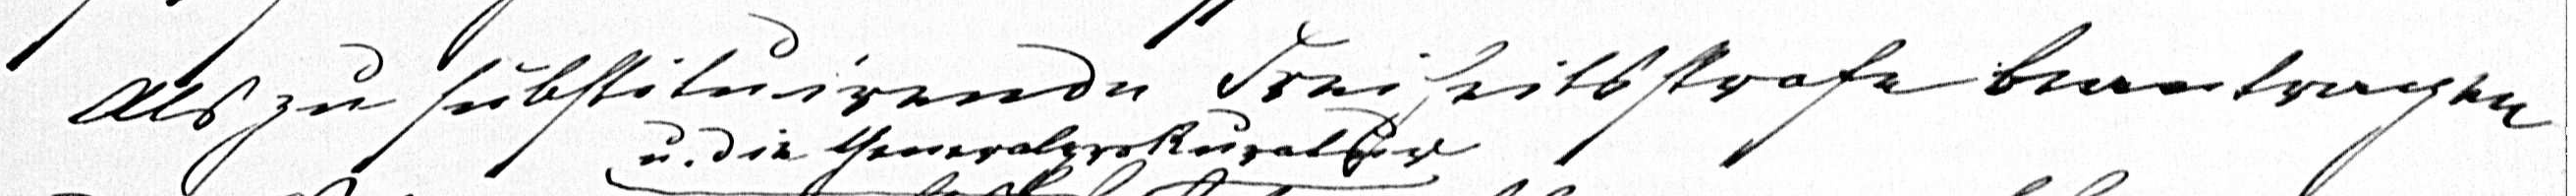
Als zu substituirende Freiheitsstrafe beantragen
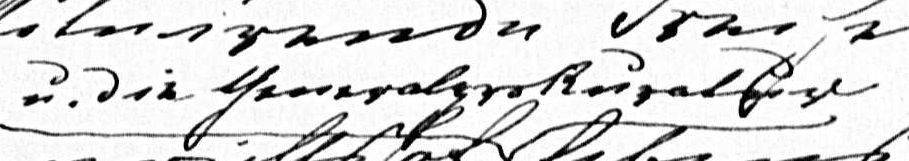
u die Generalprokuratur
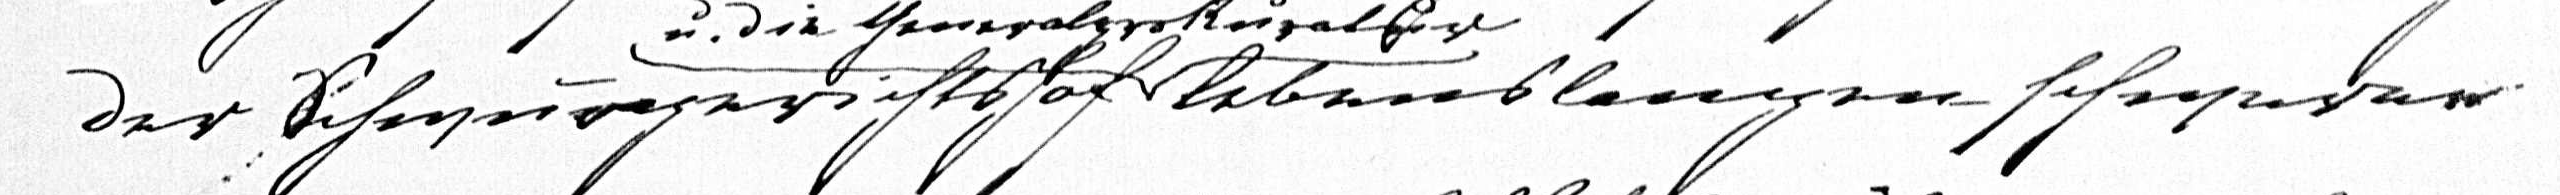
der Schwurgerichtshof lebenslangen schweren
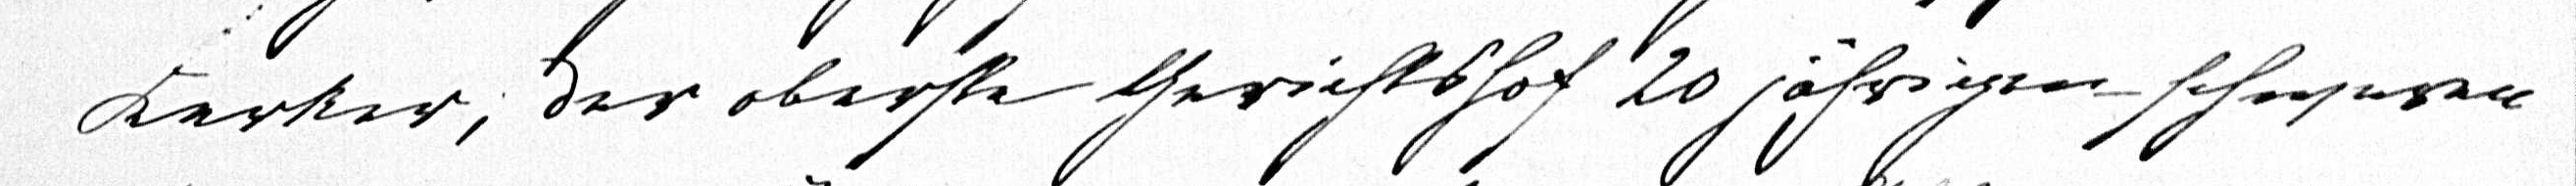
Kerker, der oberste Gerichtshof 20 jährigen schweren
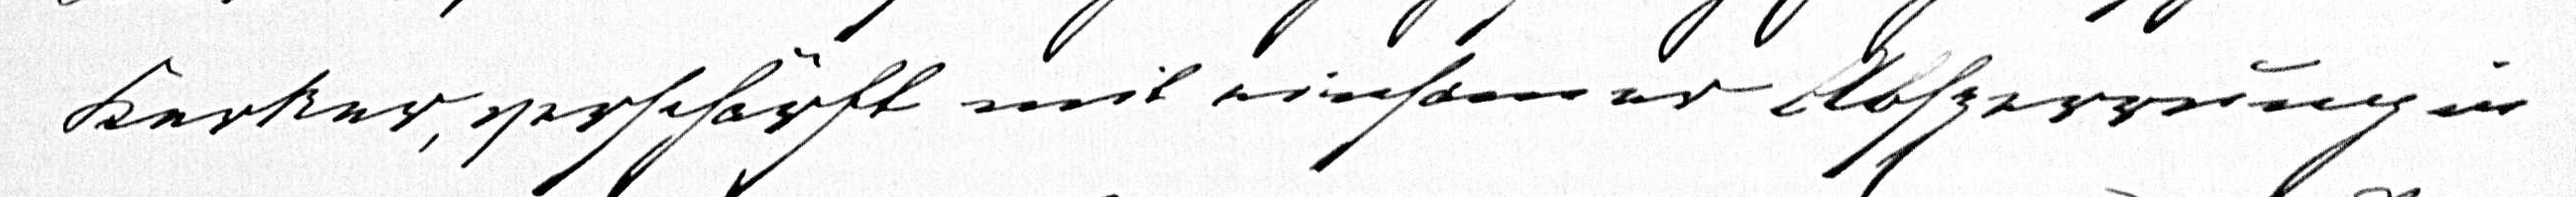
Kerker, verschärft mit einsamer Absperrung in
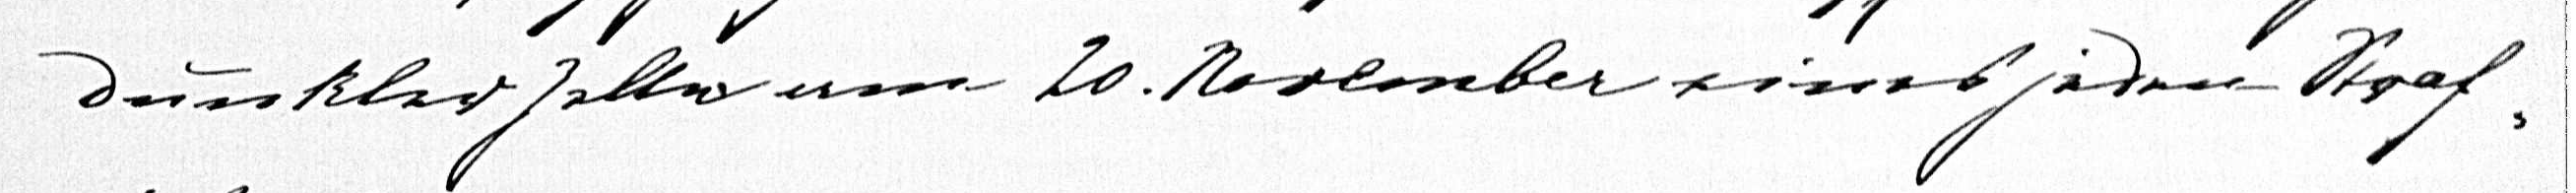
dunkler Zelle am 20. November eines jeden Straf¬
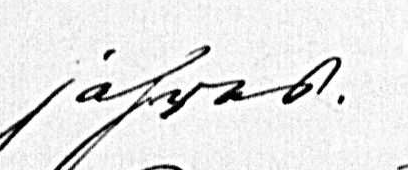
jahres.
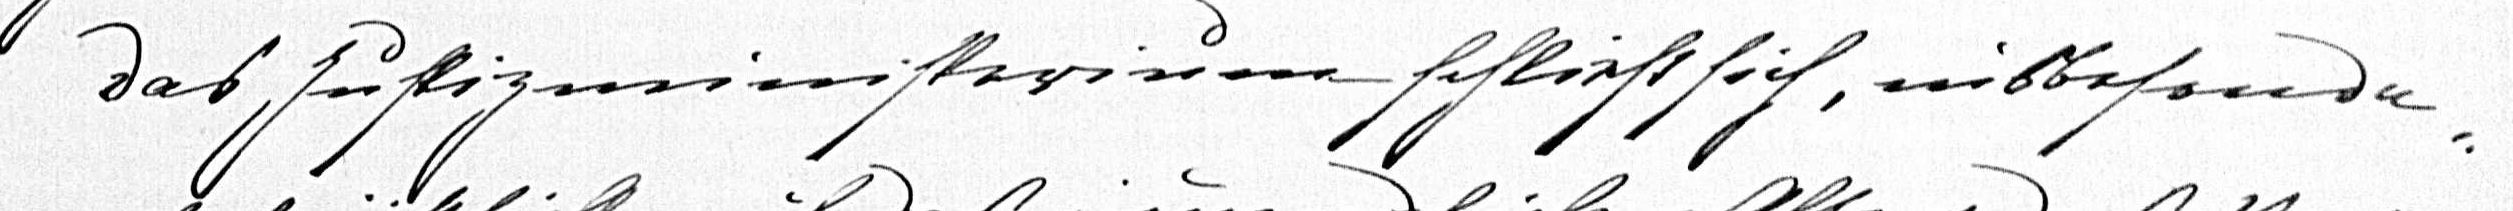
Das Justizministerium schließt sich, insbesondere
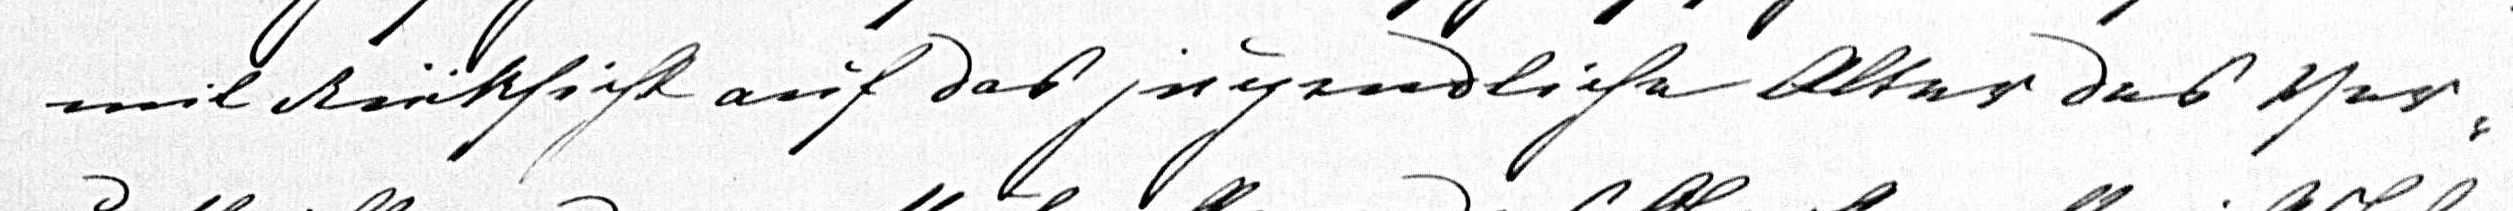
mit Rücksicht auf das jugendliche Alter das Ver¬
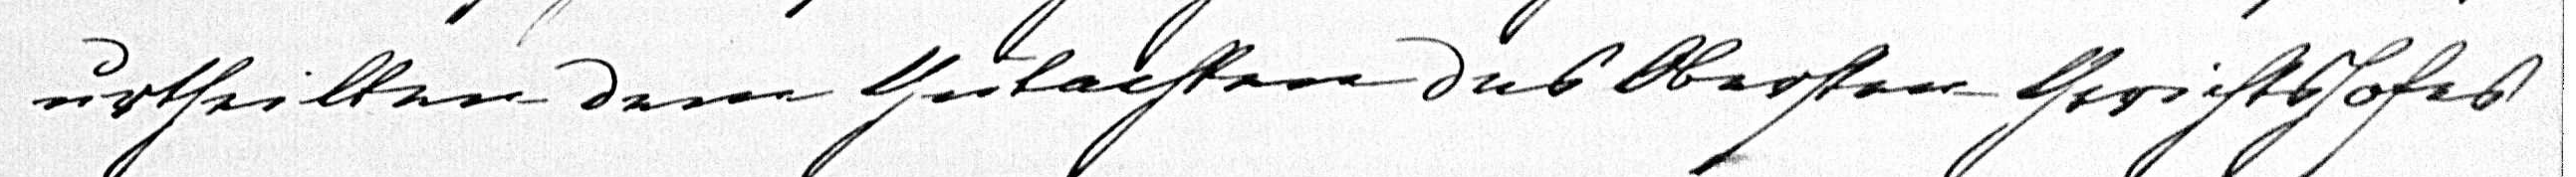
urtheilten dem Gutachten des Obersten Gerichsthofes
